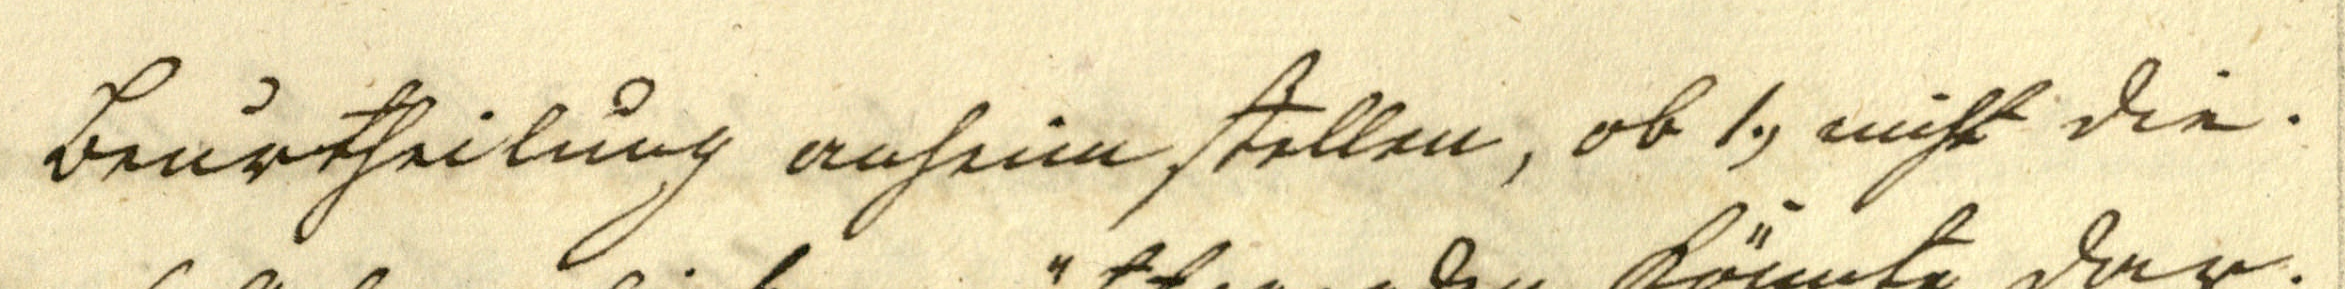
Beurtheilung anheim stellen, ob 1., nicht die¬
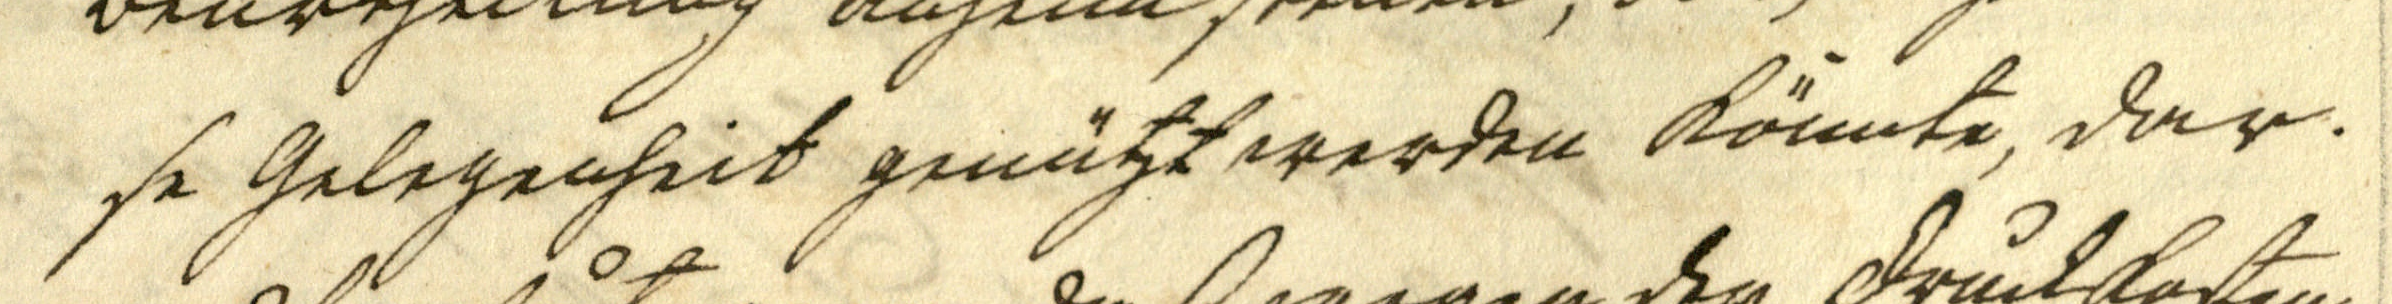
se Gelegenheit genützt werden könnte dar¬
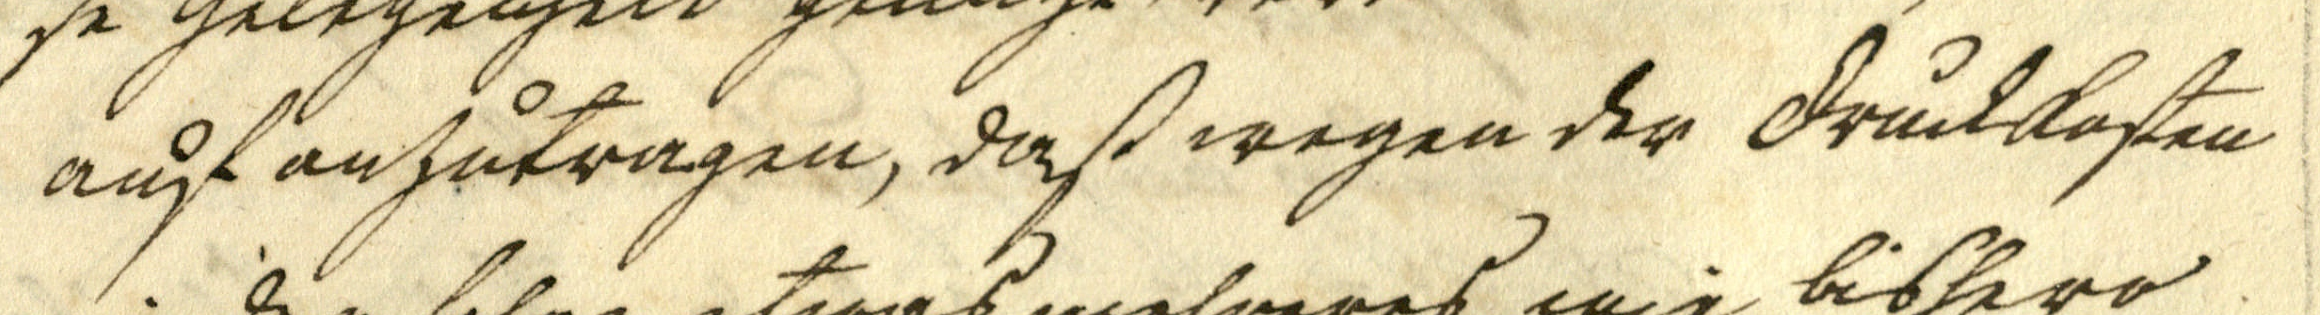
auf anzutragen, daß wegen der Druckkosten
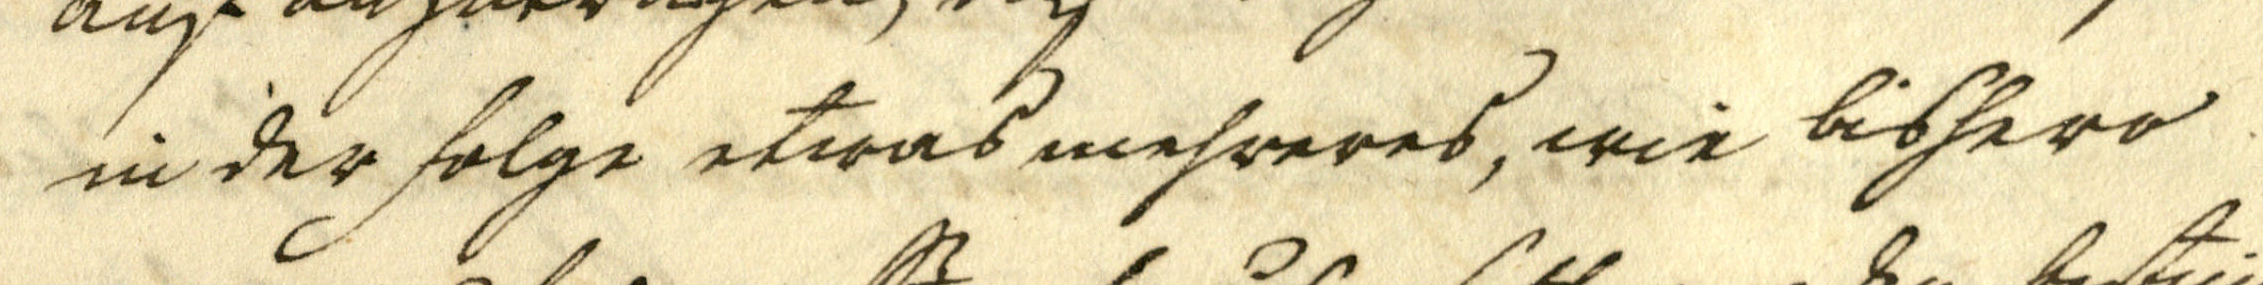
in der Folge etwas mehreres, wie bishero
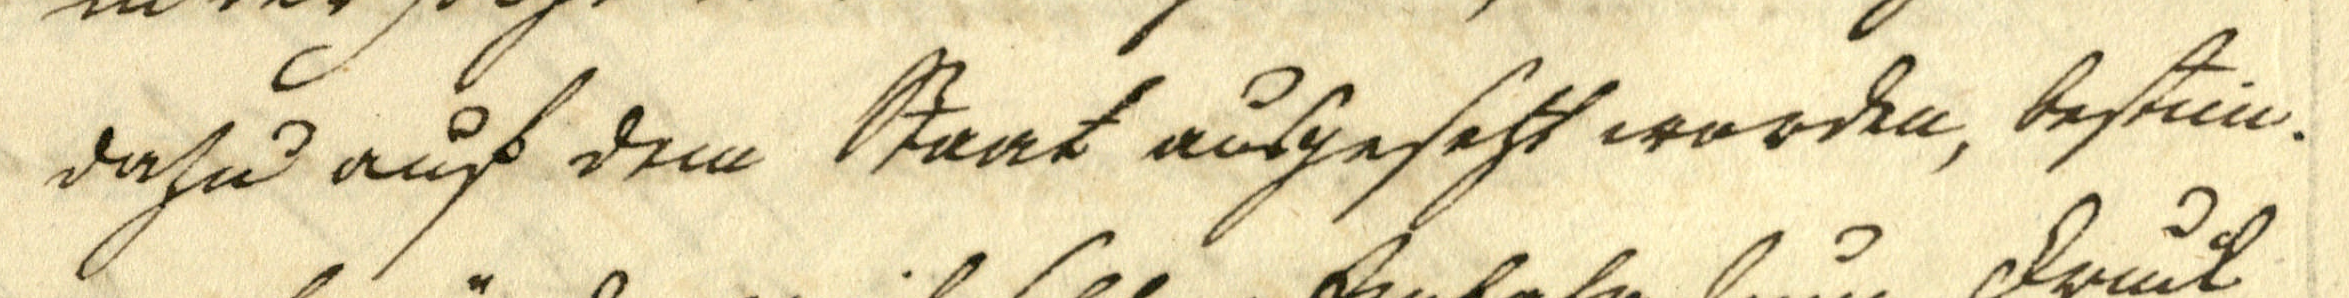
dazu auf dem Staat ausgesetzt worden, bestim¬
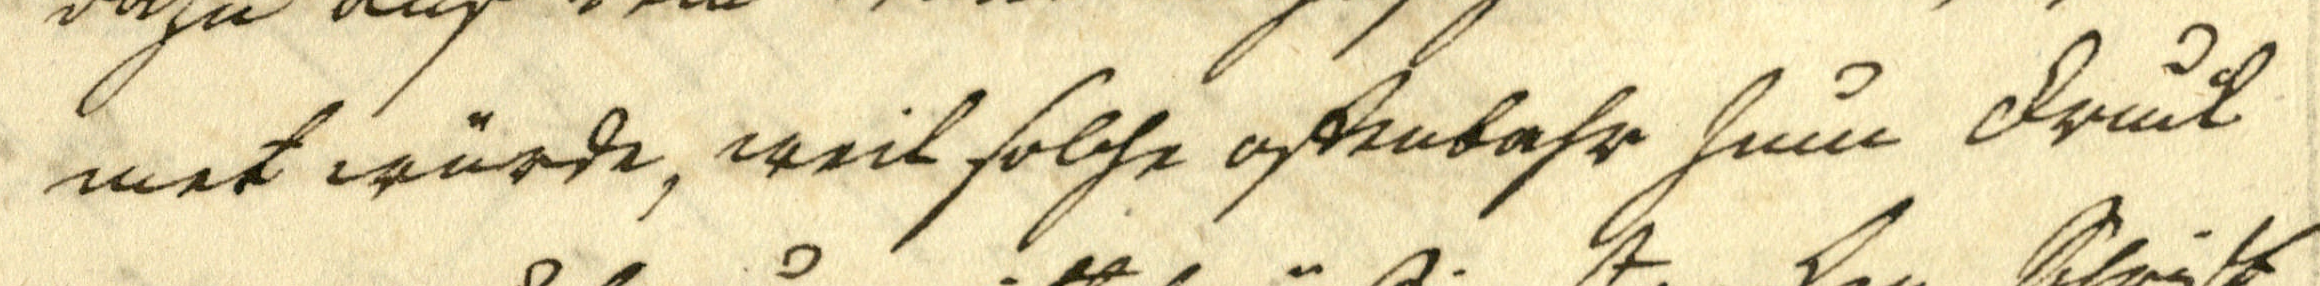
met würde, weil solche offenbahr zum Druck
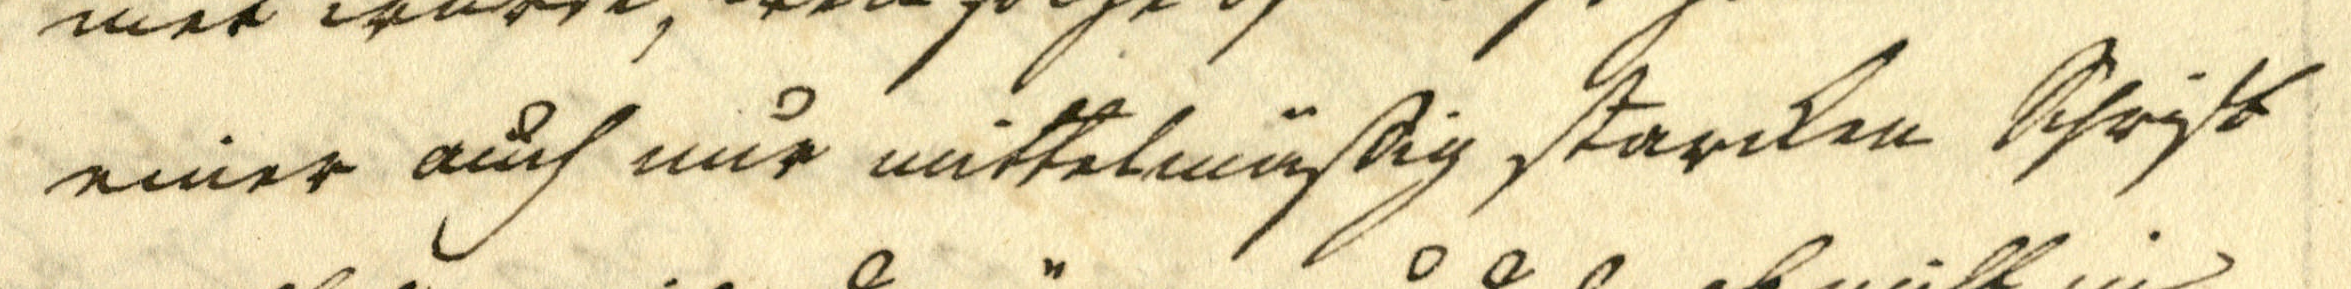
einer auch nur mittelmäßig starcken Schrift
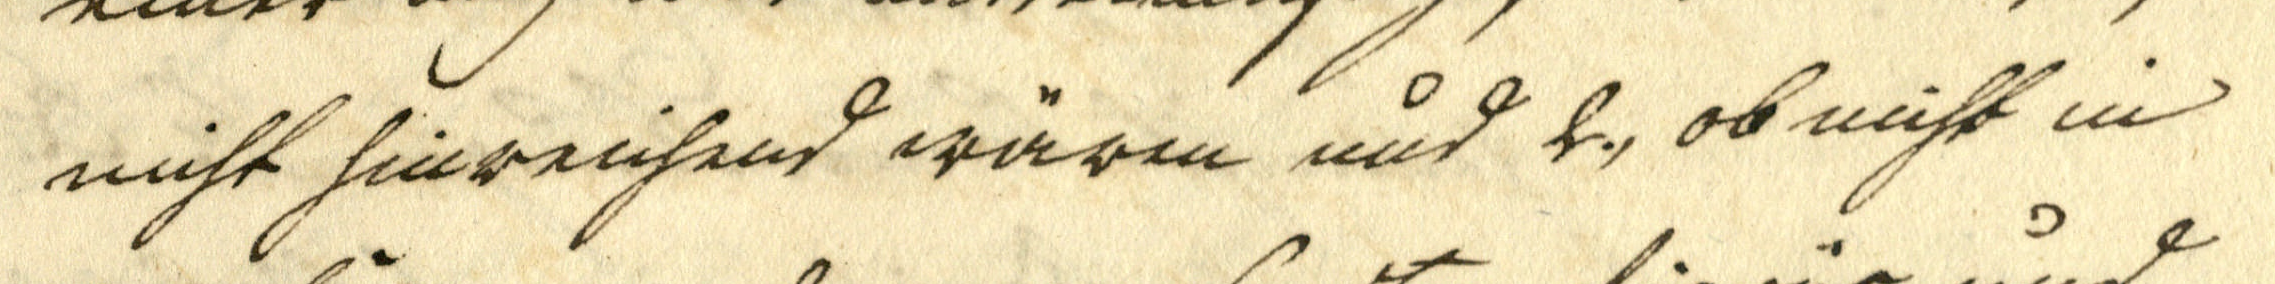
nicht hinreichend wären und 2., ob nicht in
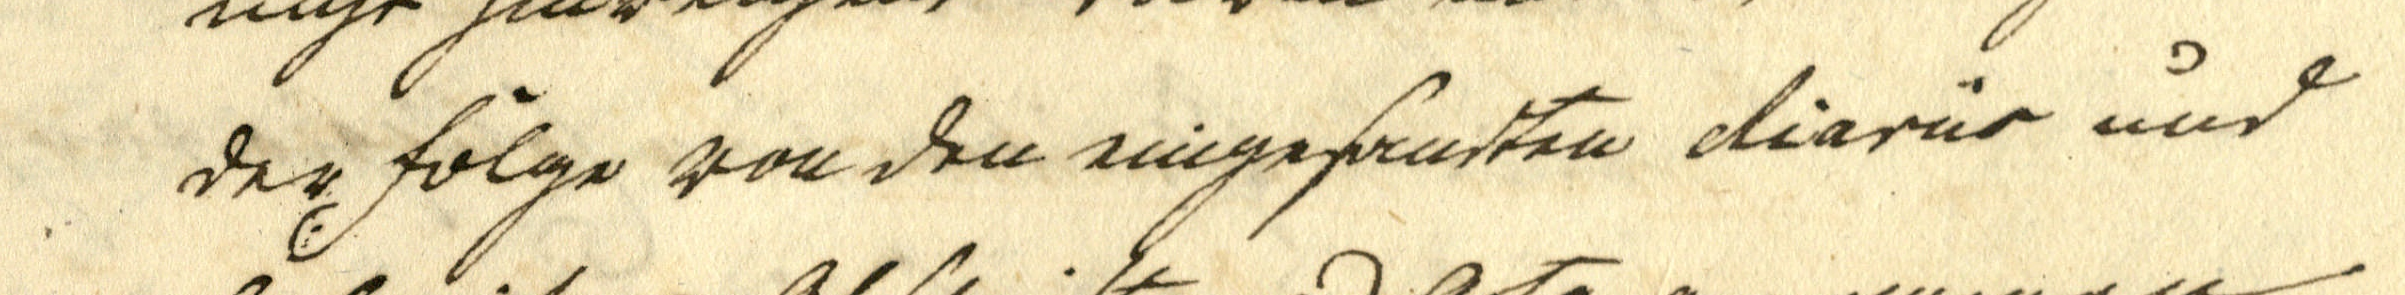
der Folge von den eingesandten diariis und
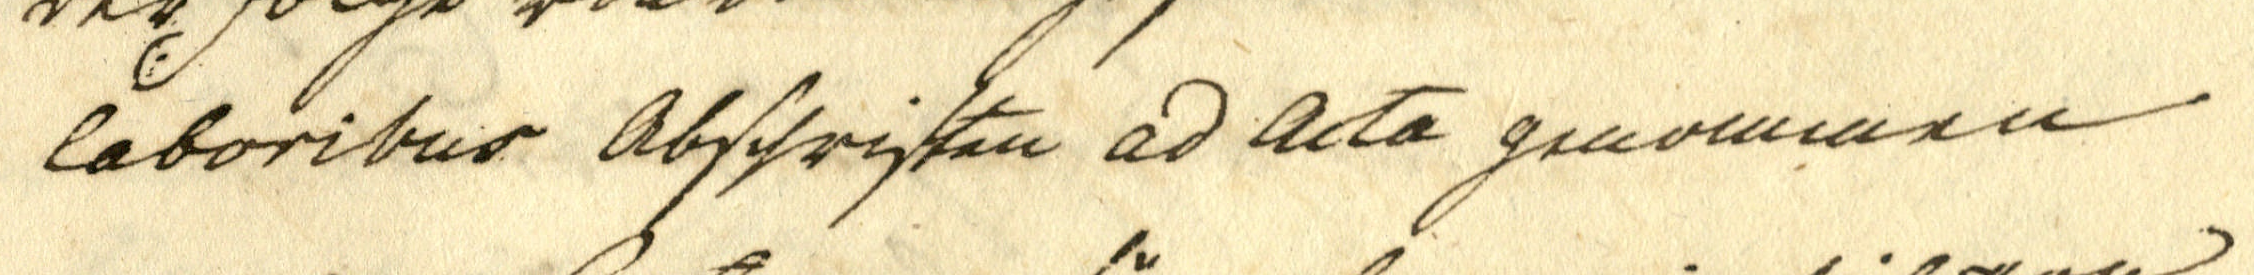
laboribus Abschriften ad Acta genommen
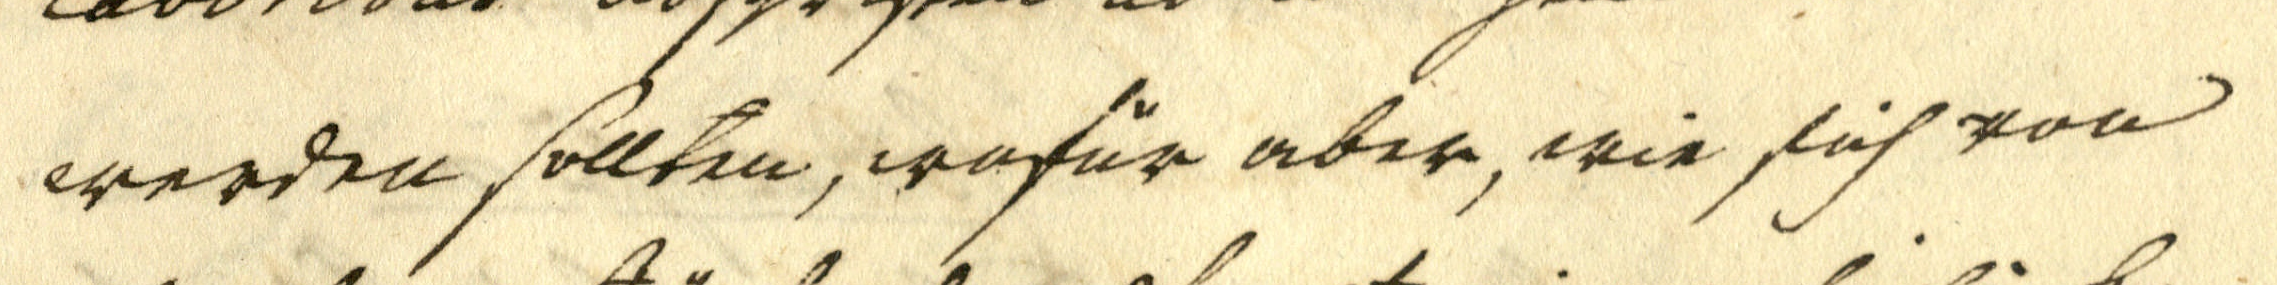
werden sollten, wofür aber, wie sich von
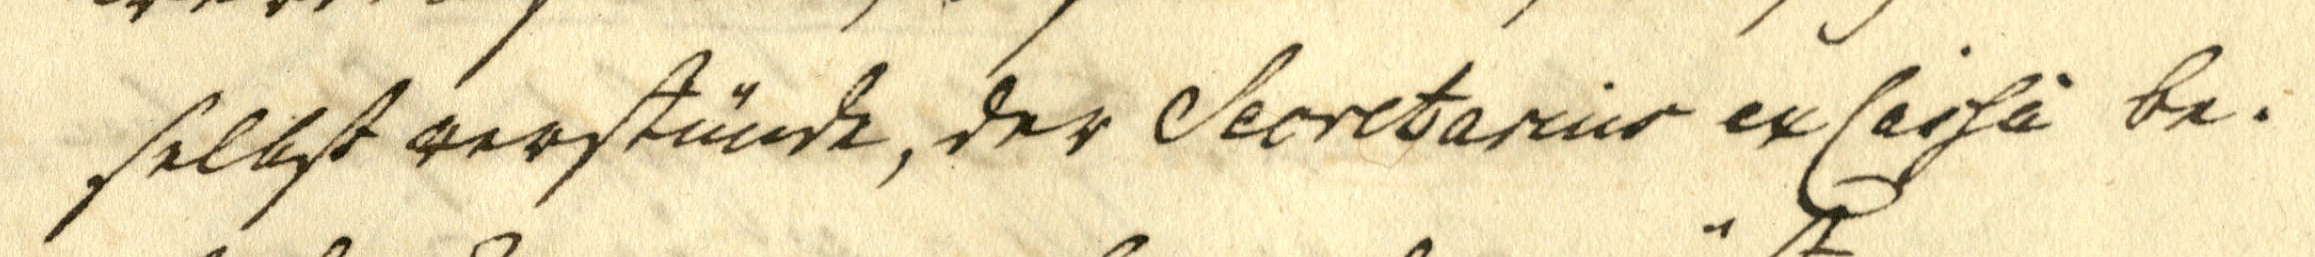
selbst verstünde, der Secretarius ex Cassa be¬
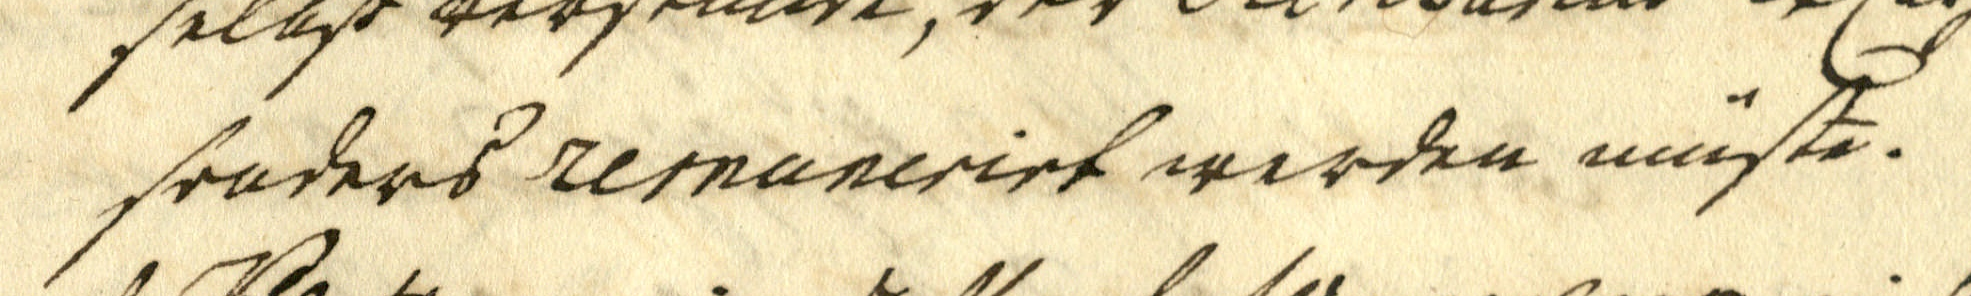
sonders remunerirt werden müßte.
